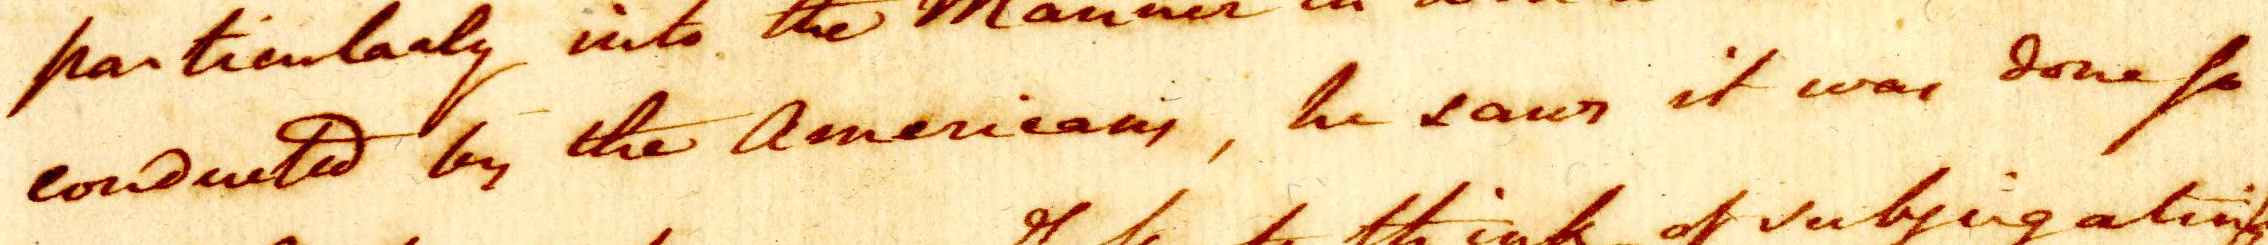conducted by the Americans, he says it was done so
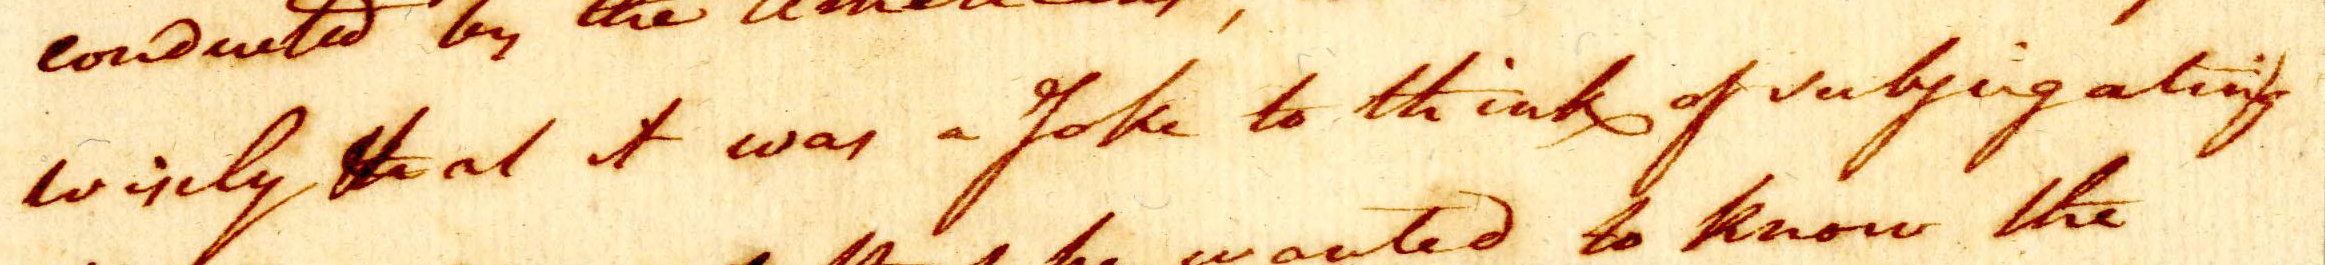wisely that it was a Joke to think of subjugating
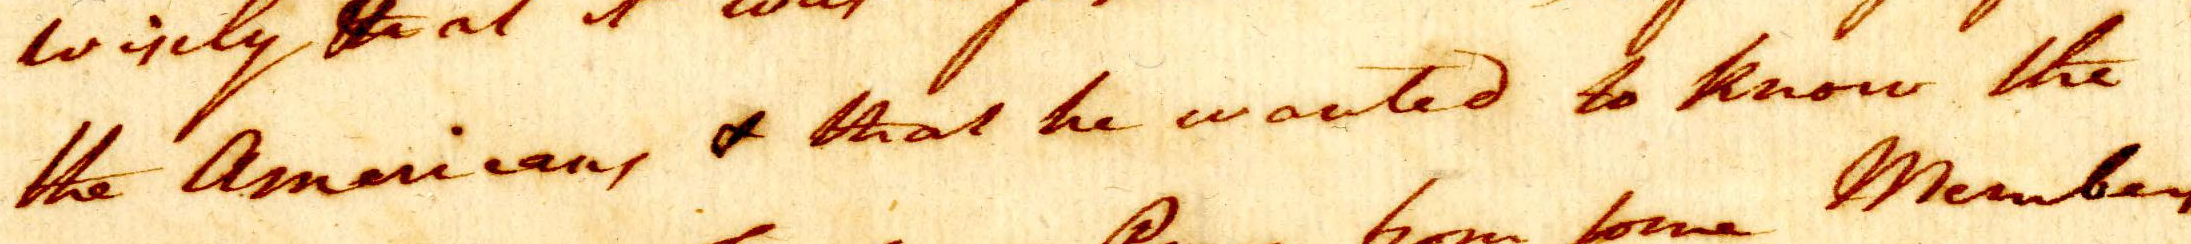the Americans & that he wanted to know the
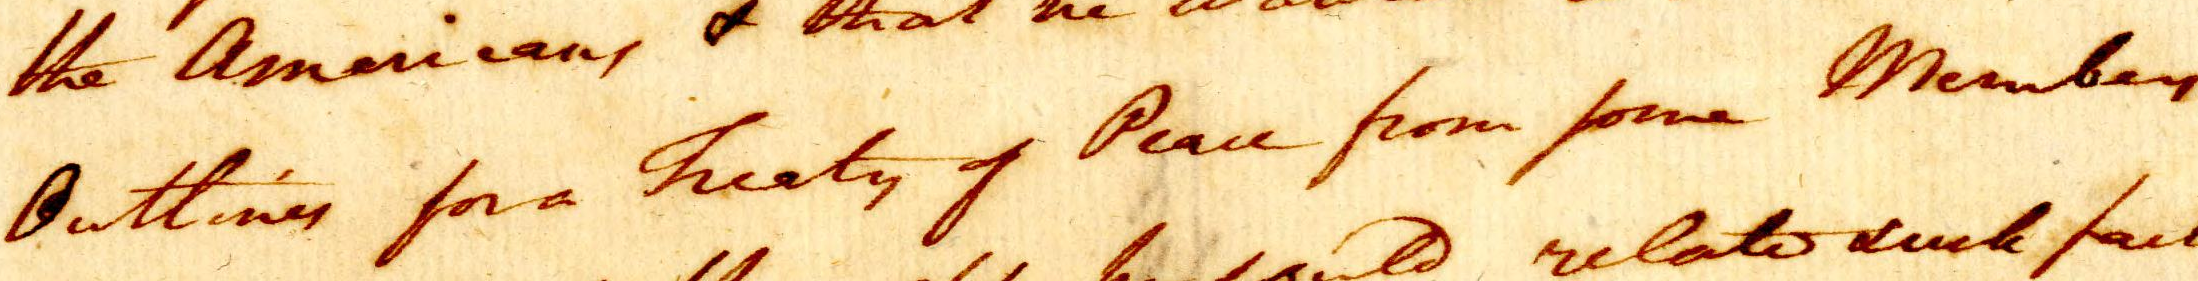Outlines for a Treaty of Peace from some Members
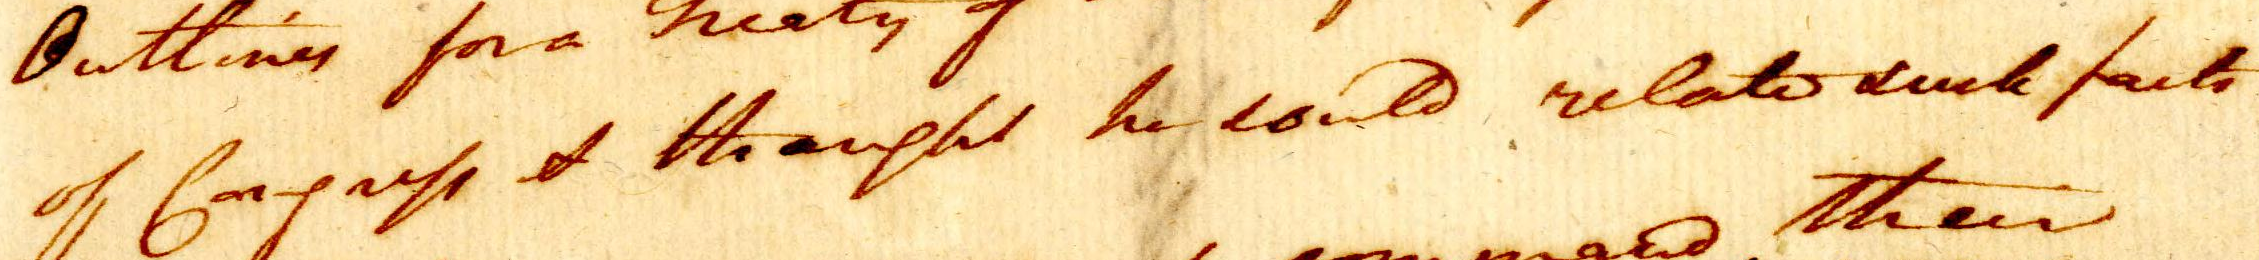of Congress & thought he could relate such facts
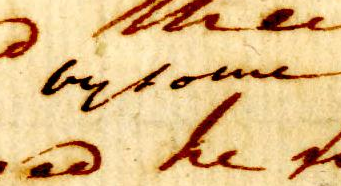by some
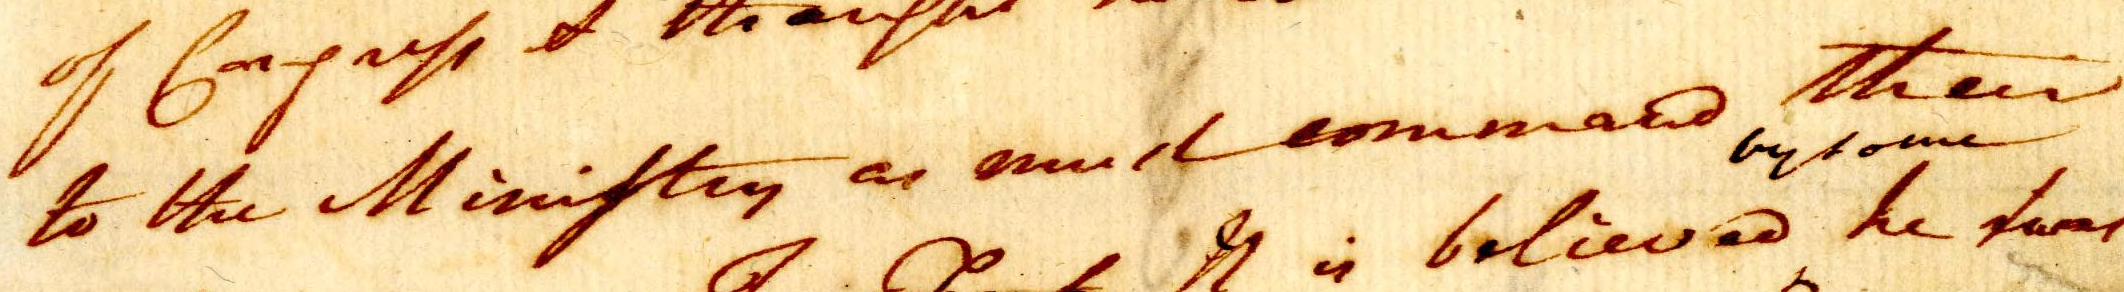to the Ministry as much command their
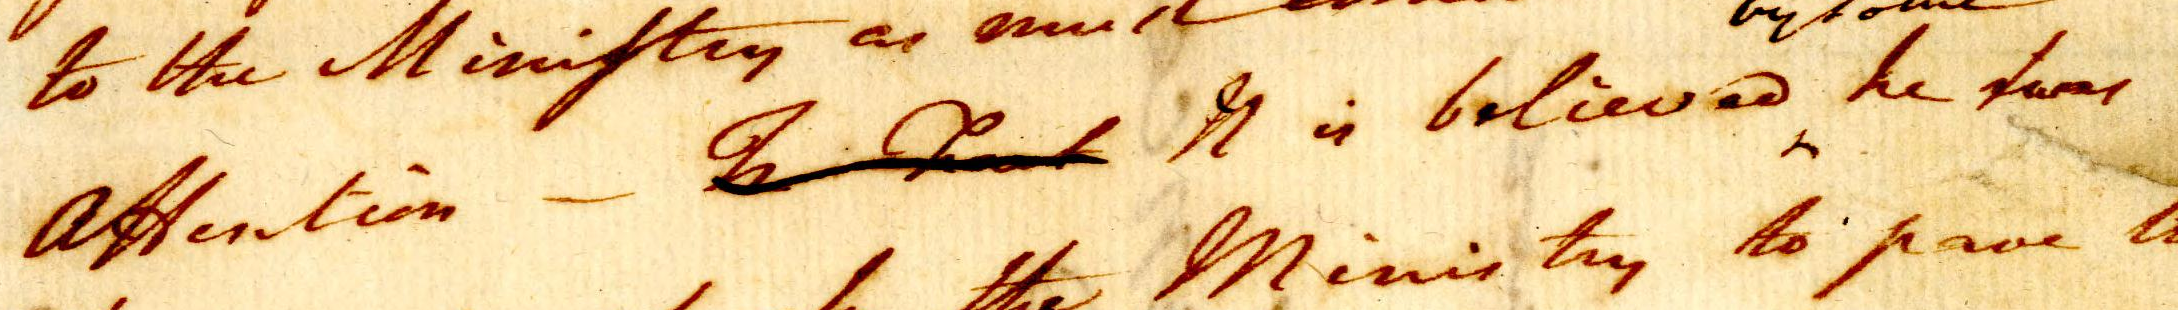Attention. In Truth It is believed ^ he has
